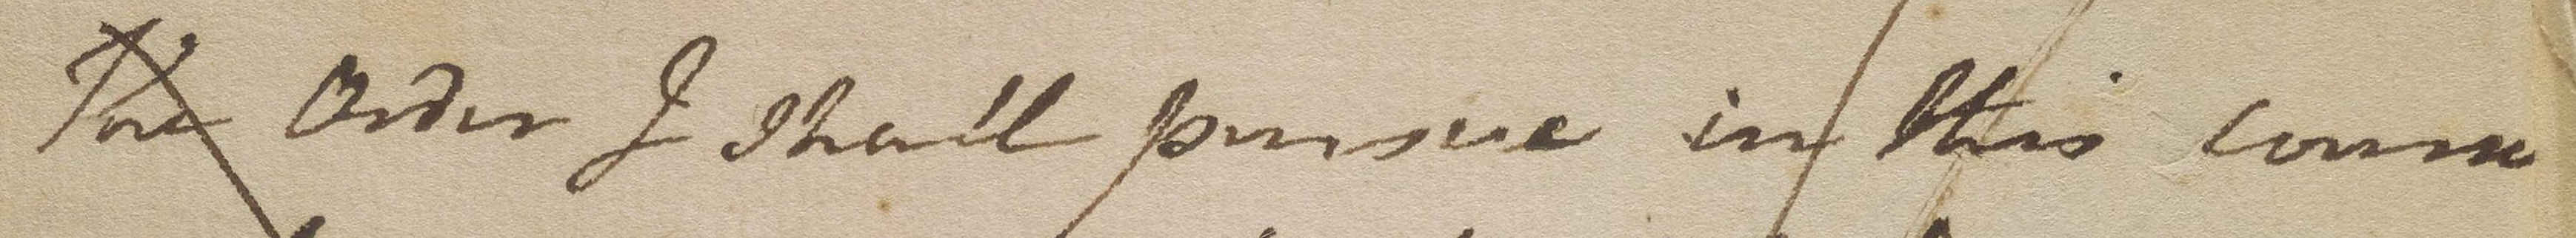The order I shall pursue in this course
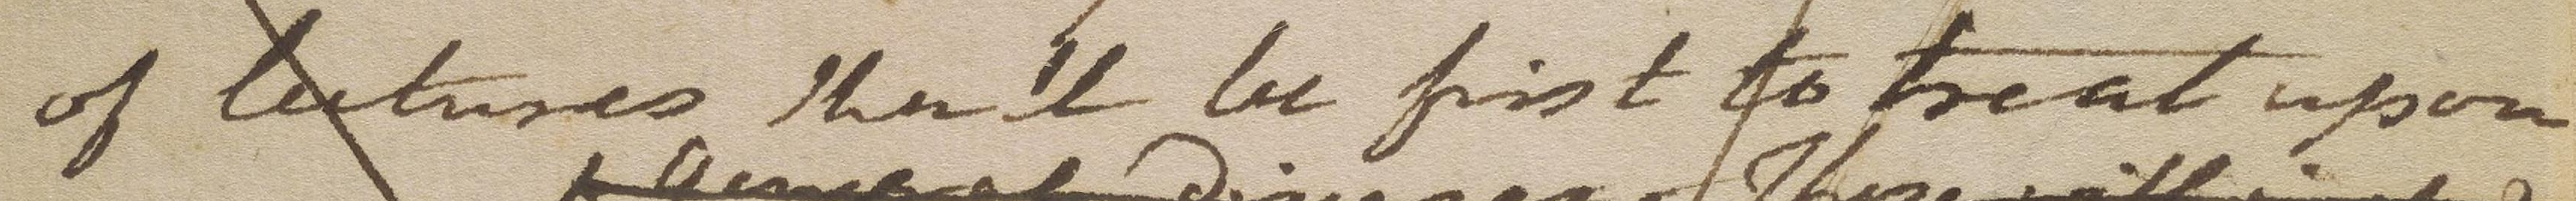of lectures shall be first to treat upon
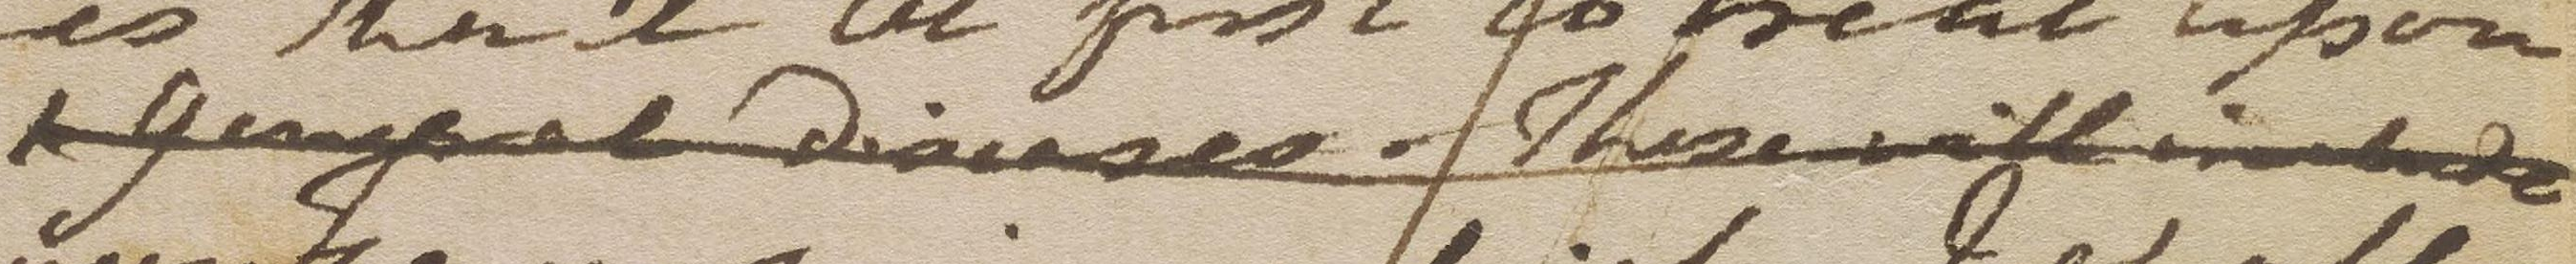general disease. These will include
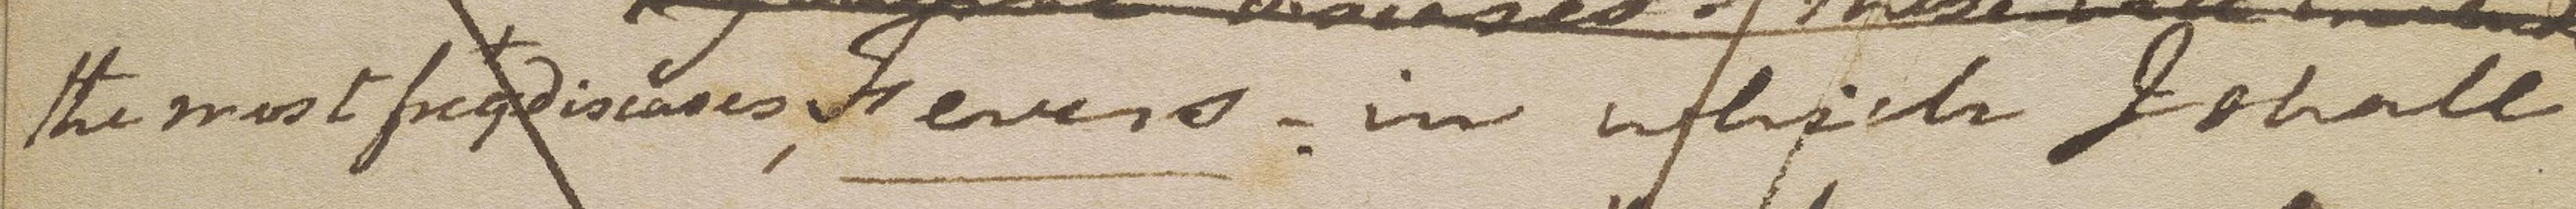the most freq^t diseases, fevers, in which I shall
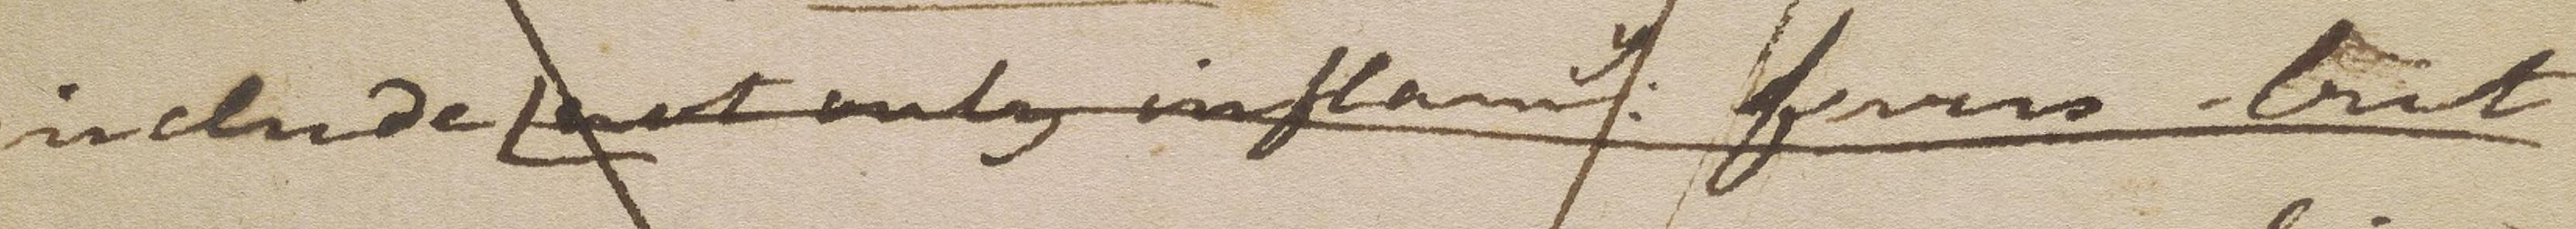include not only inflam^y fevers but
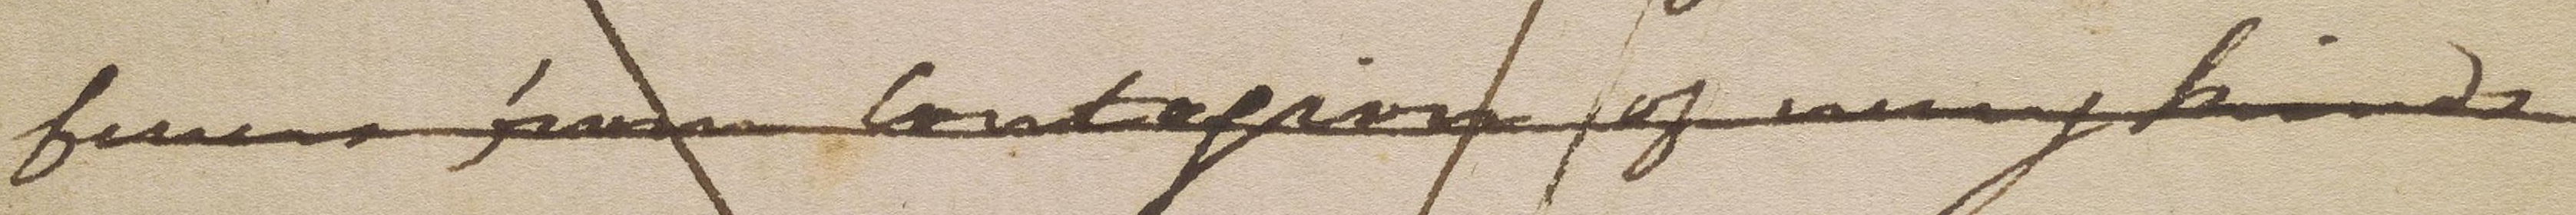fevers from contagion of every kind
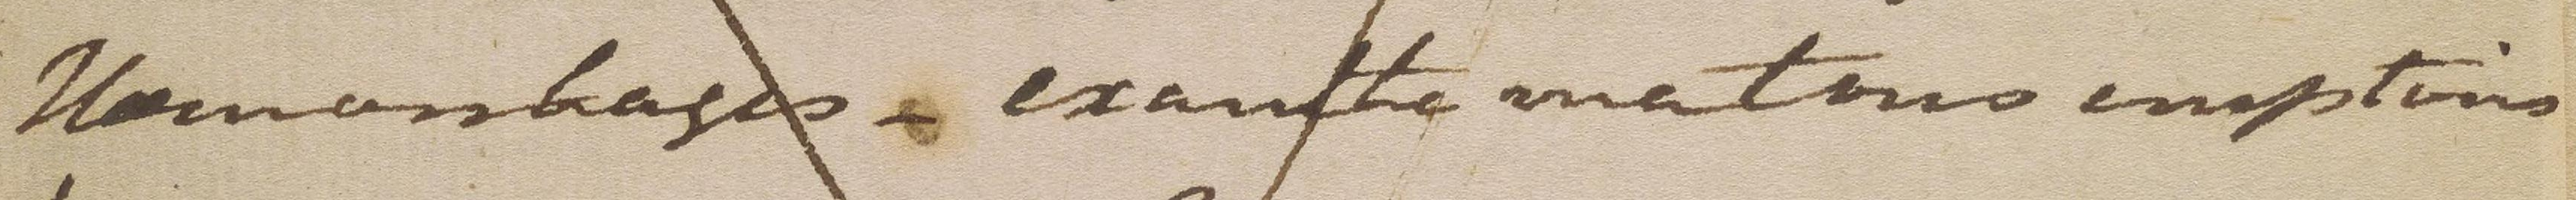Hemorrhages, exam the maters eneptions
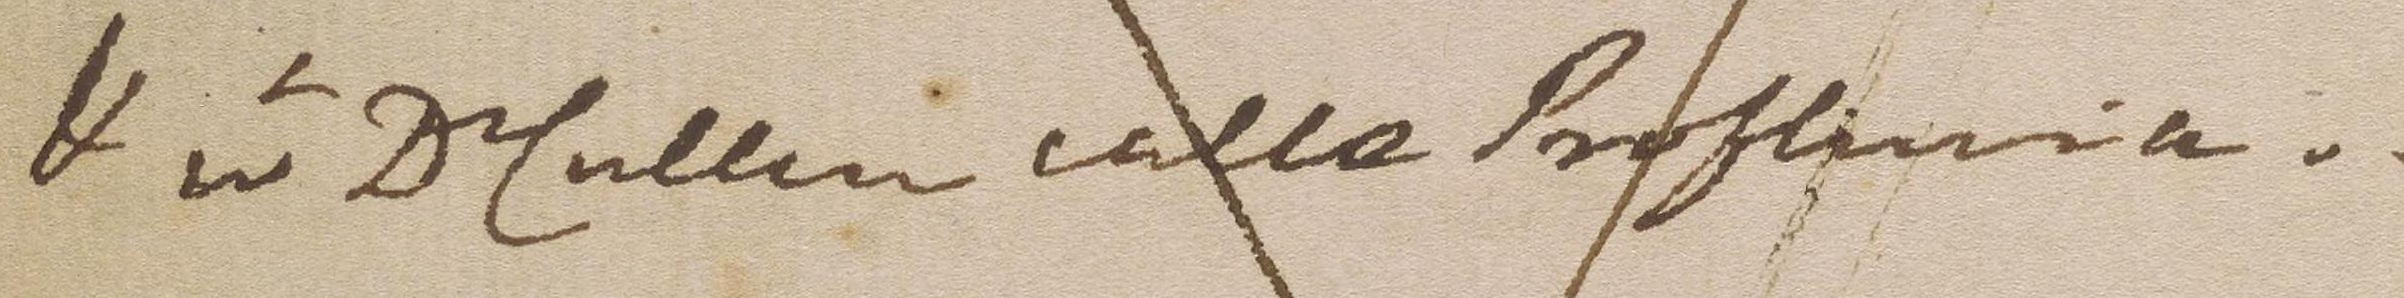& w^h Dr. Cullen calls Proflieria.
